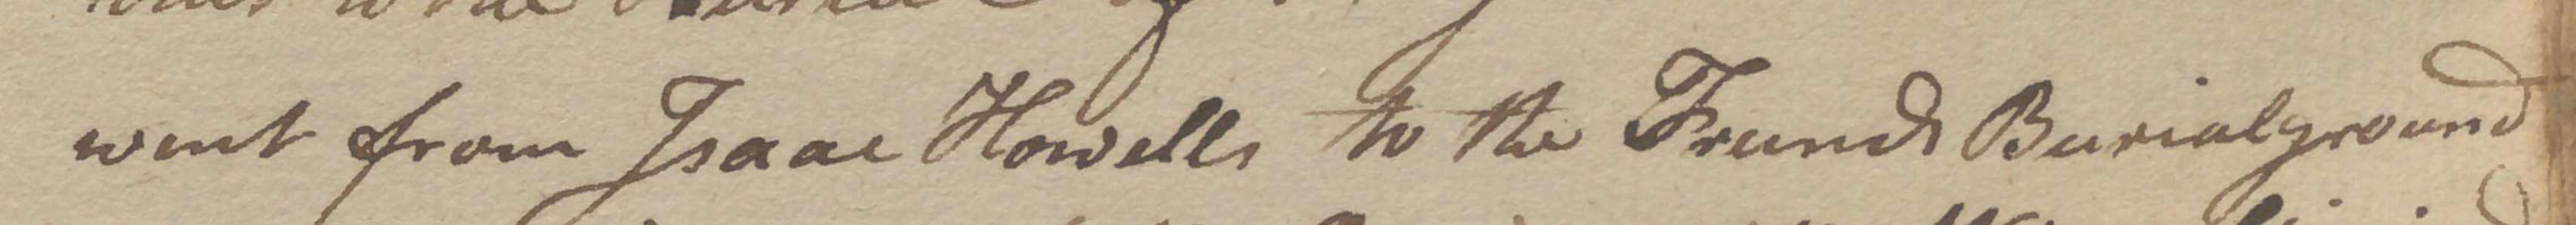went from Isaac Howells to the Friends Burial ground
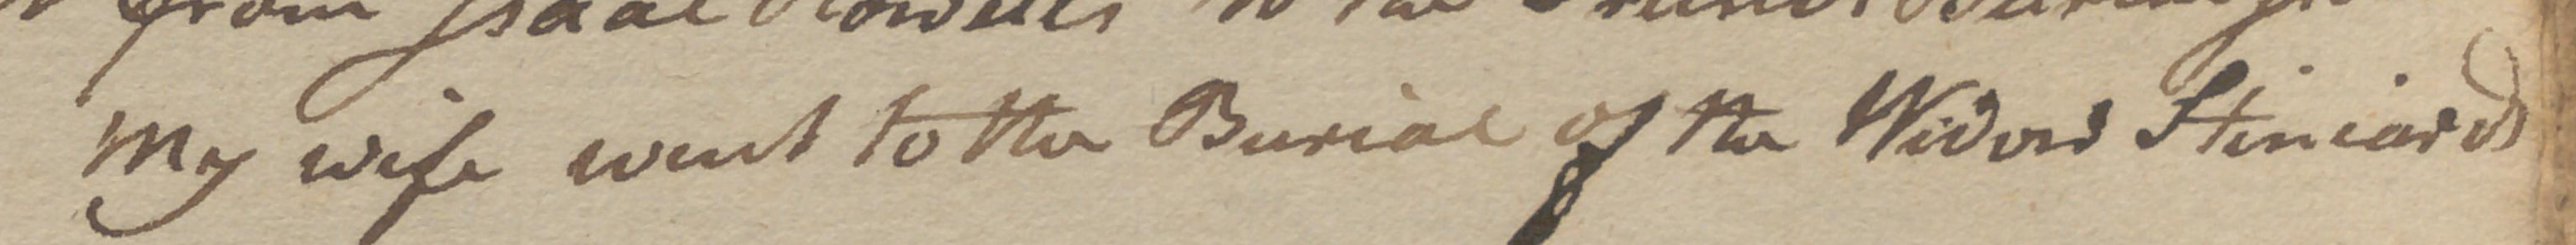my wife went to the Burial of the Widow Stiniards
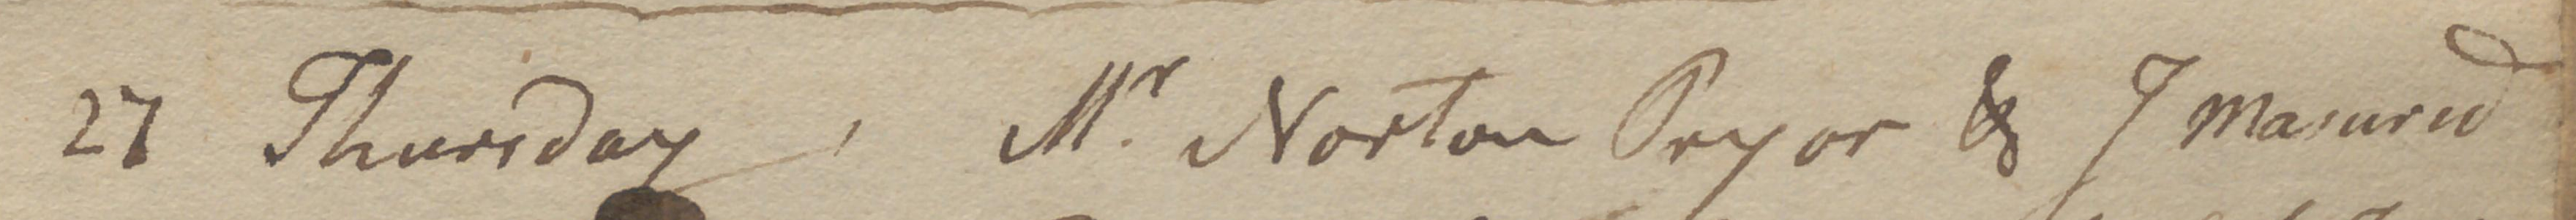27 Thursday. M^r. Norton Pryor & I Masured
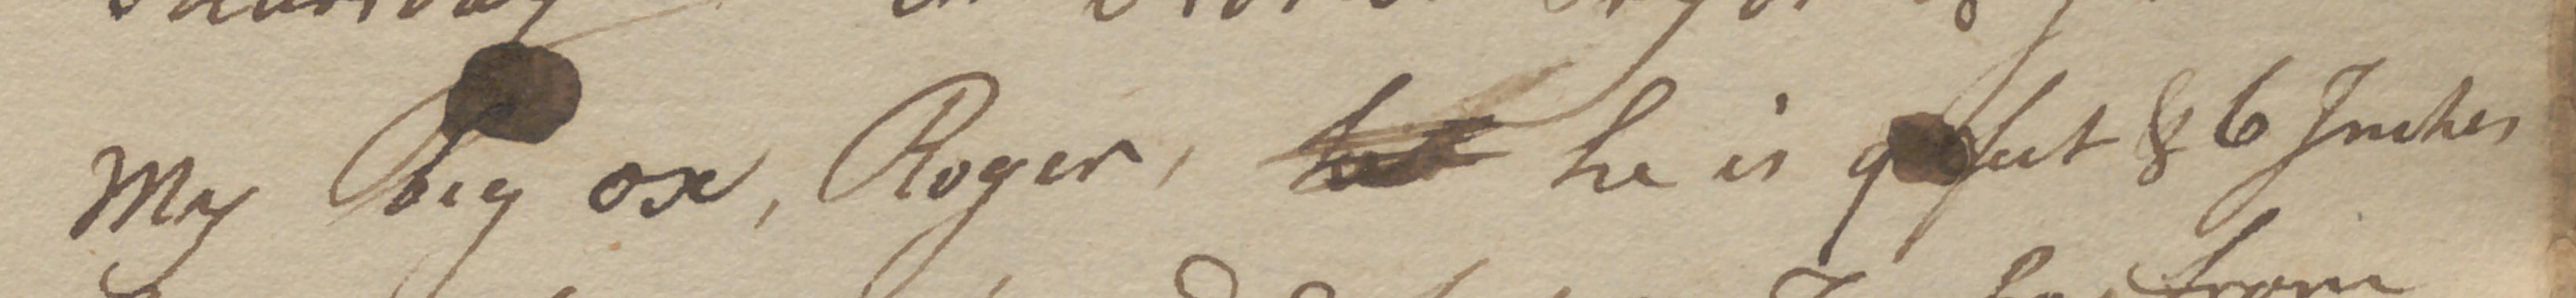My Big oxe, Roger, [__] he is 9 feet & 6 Inches
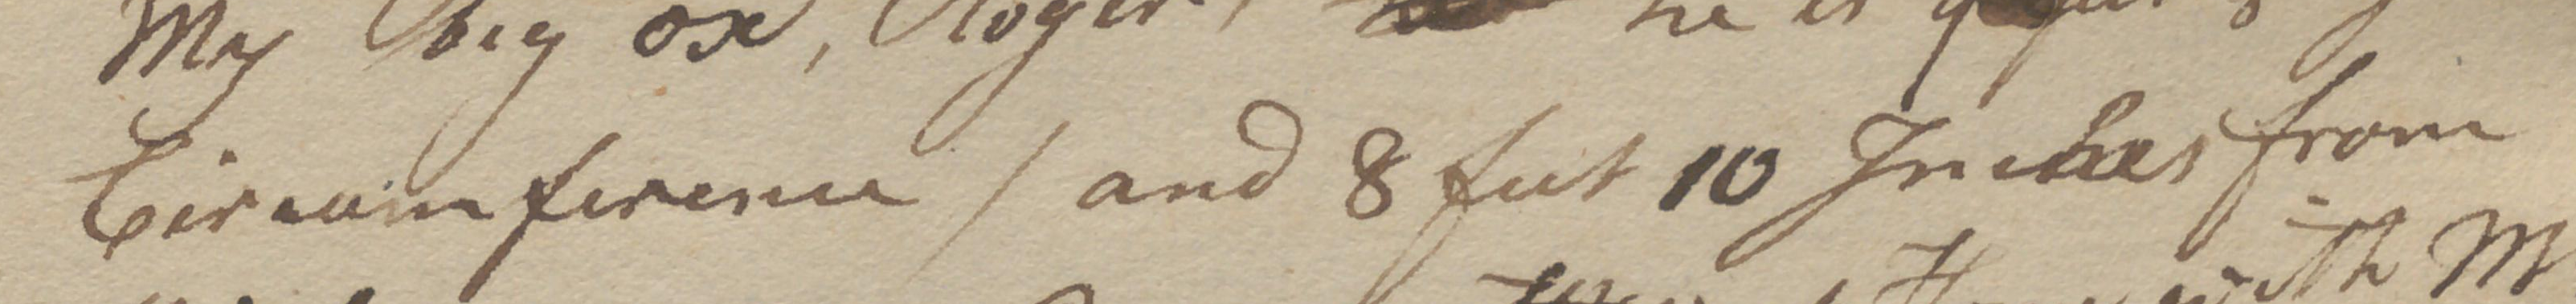Circumference / and 8 feet 10 Inches from
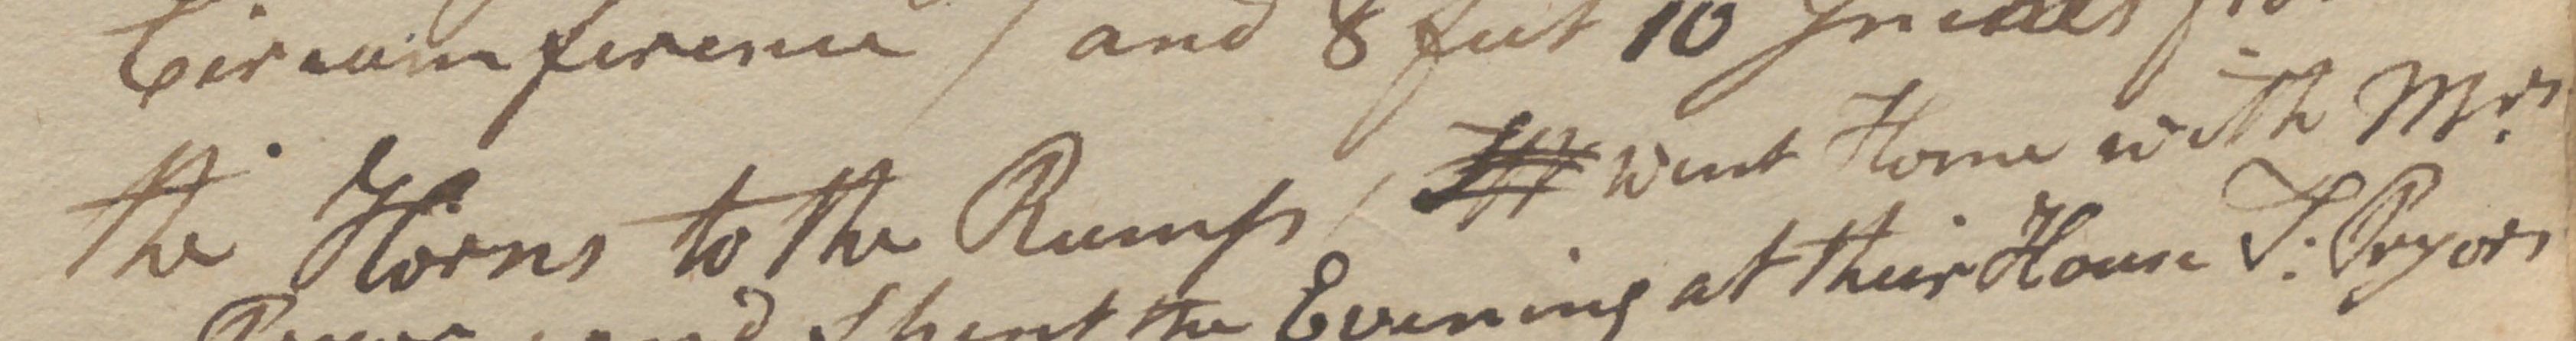the Horns to the Rump, [___] went Home with M^r.
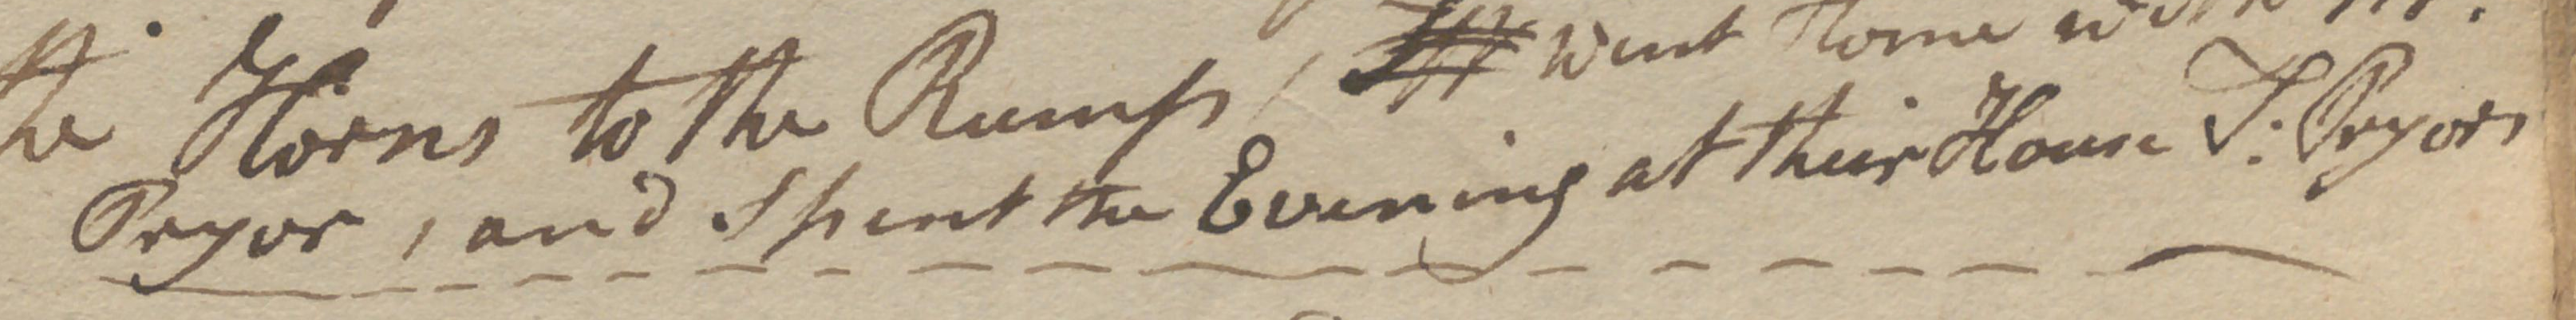Pryor, and spent the Evening at their House T: Pryor
